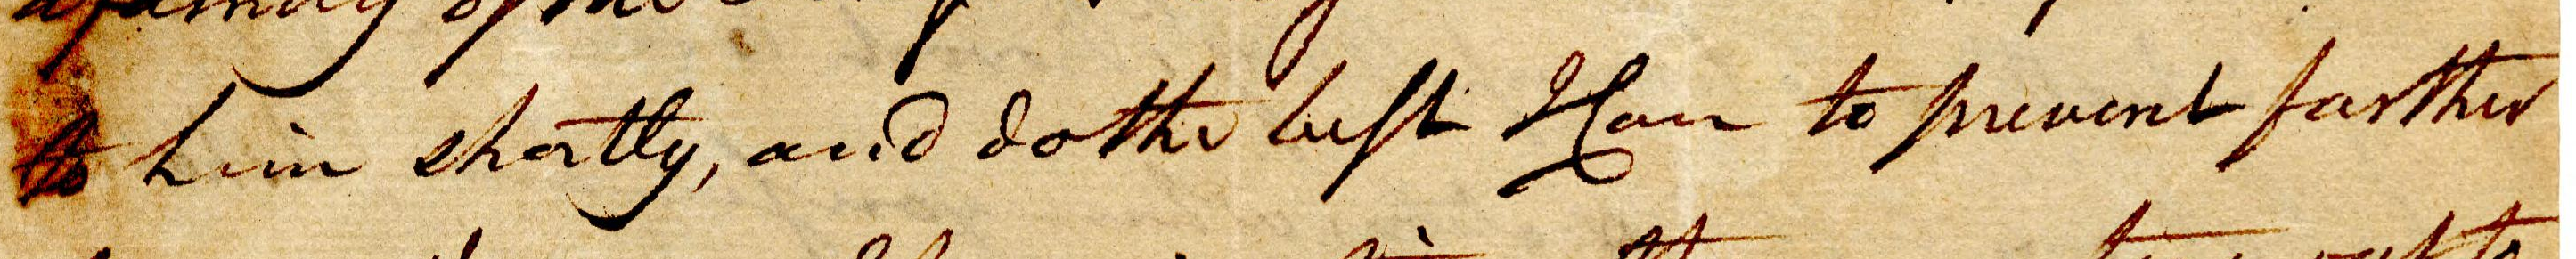to him shortly, and do the best & Care to prevent farther
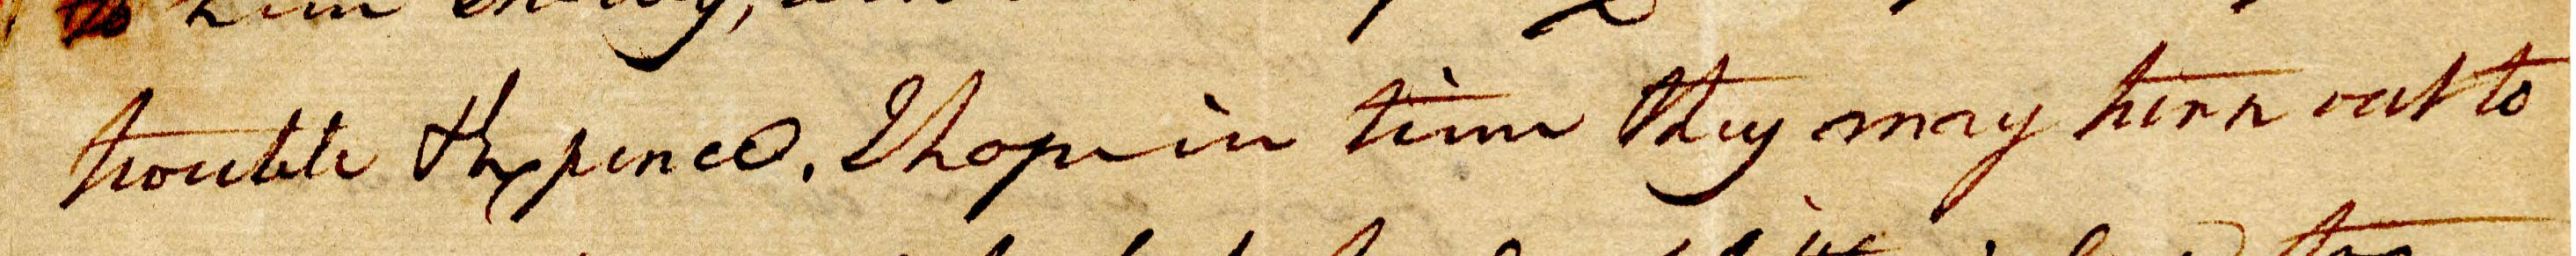trouble & expence, I hope in time they may him out to
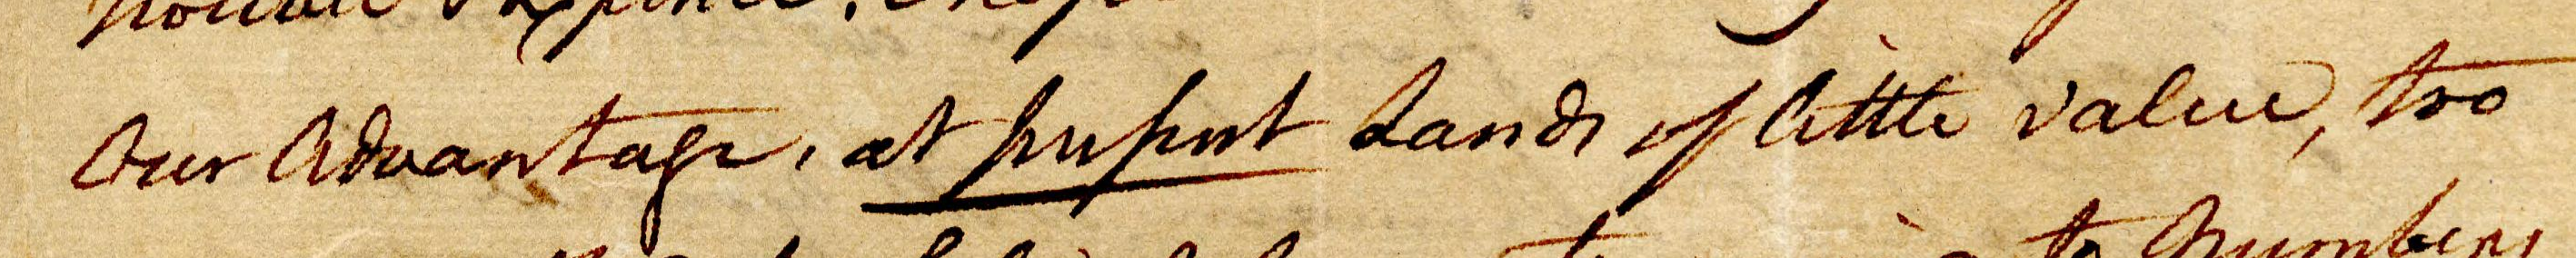Our Advantage, at present lands of little value, too
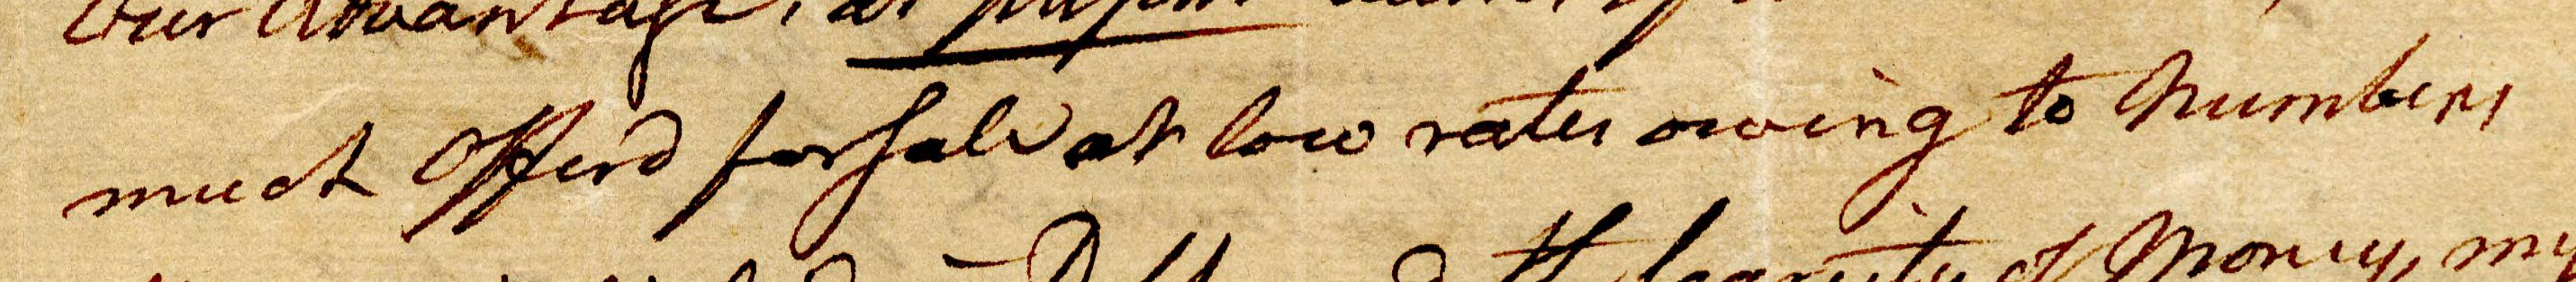much Offer'd for sale at low rates owing to Numbers
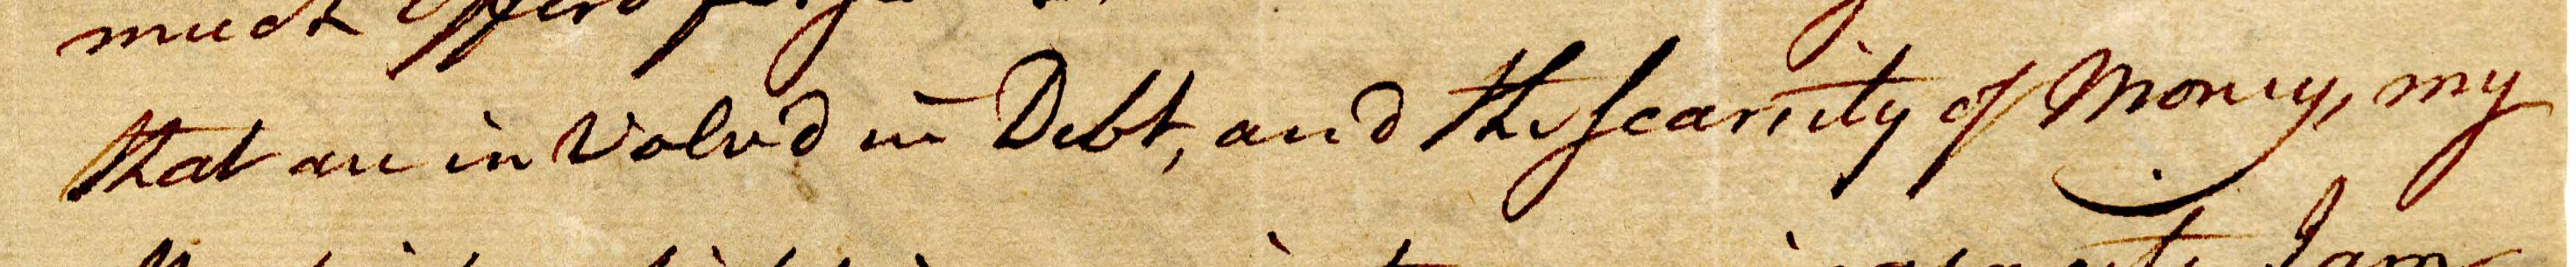that are involv'd in Debt, and the Scarcity of Money, my
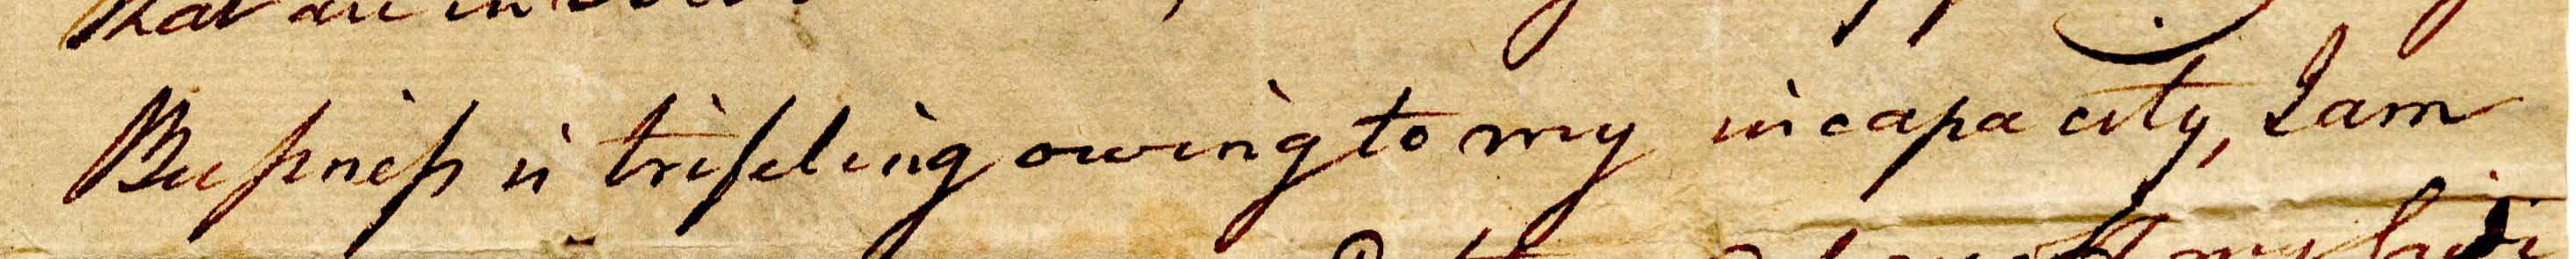Buisness is trifling owing to my incapacity, I am
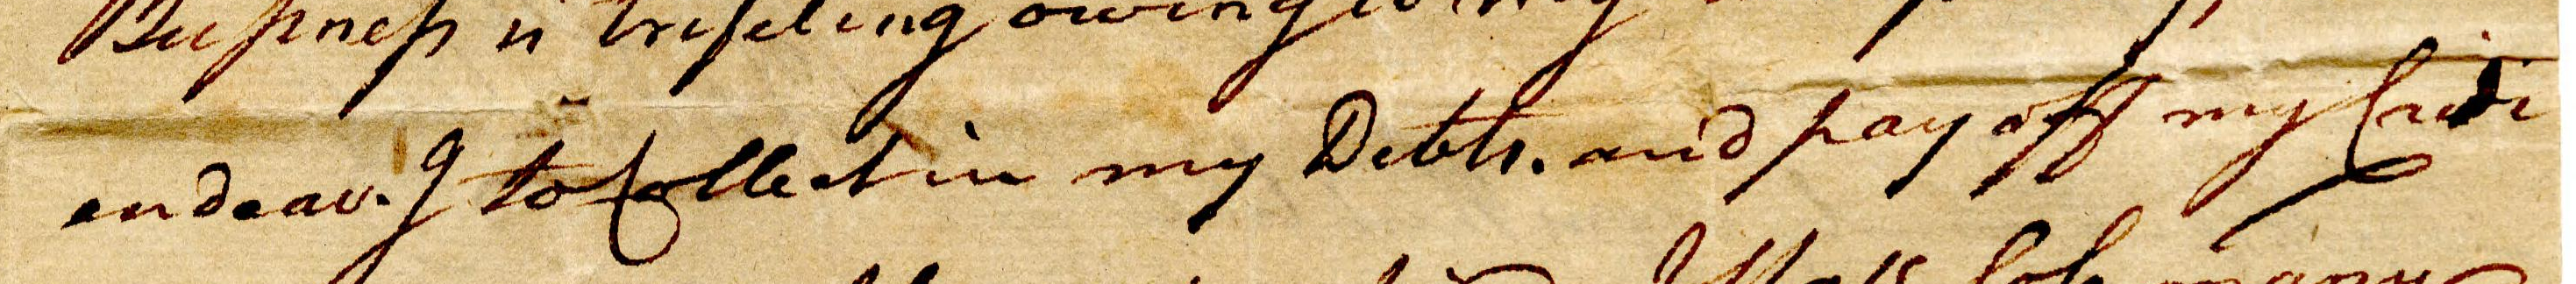endeav^g to Collect in my Debts. and pay off my credi-
